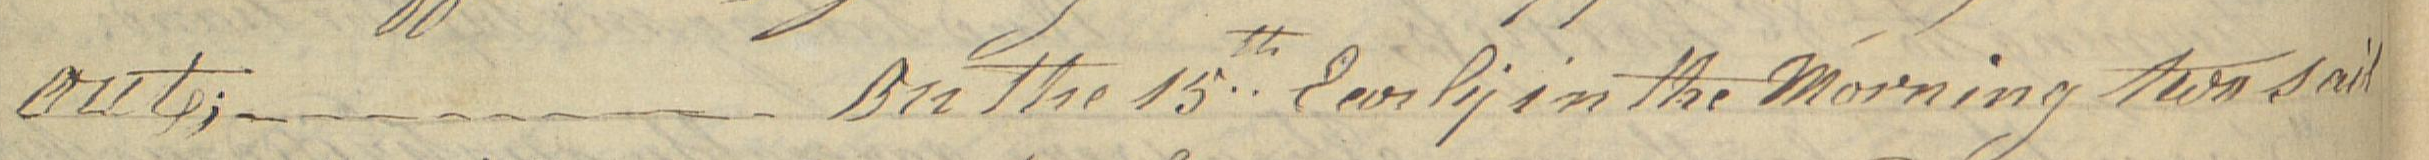out; On the 15^th. Early in the Morning two sail
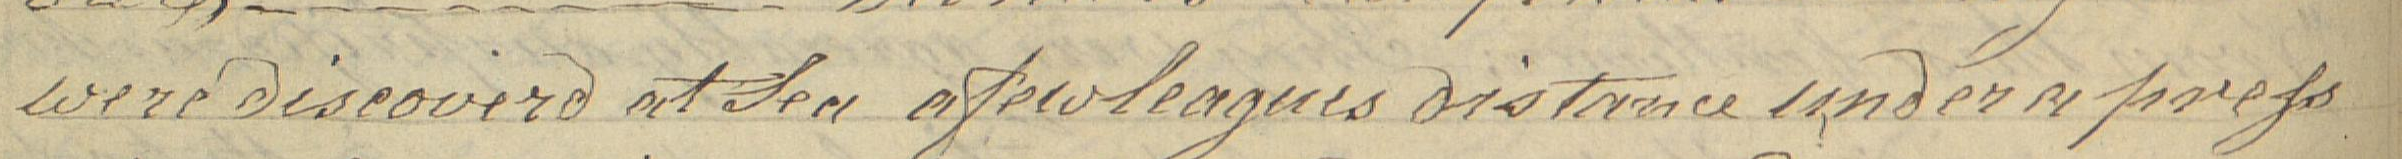were discoverd at Sea a few leagues distance under a press
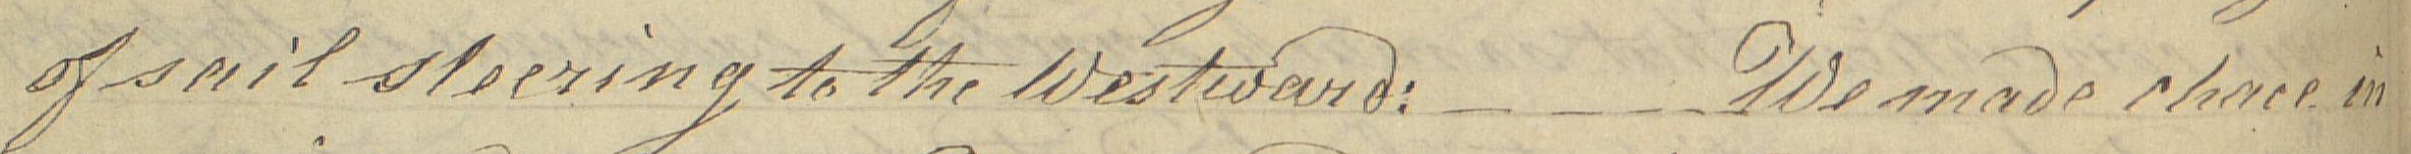of sail steering to the Westward: We made chace in
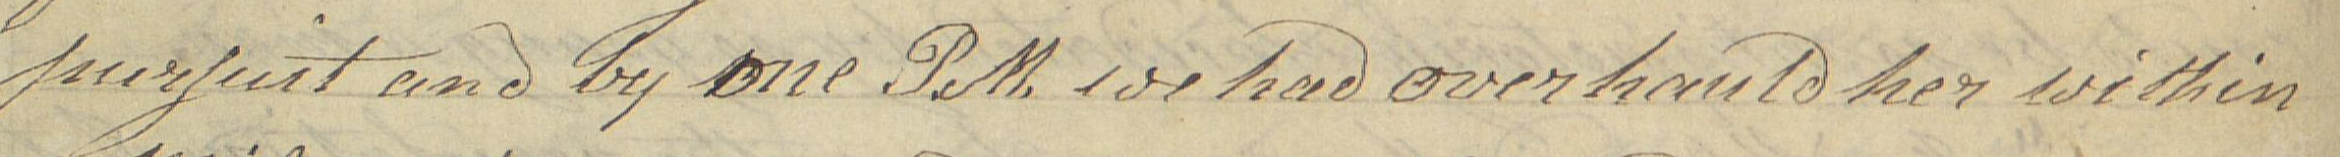pursuit and by one P.M. we had overhauld her within
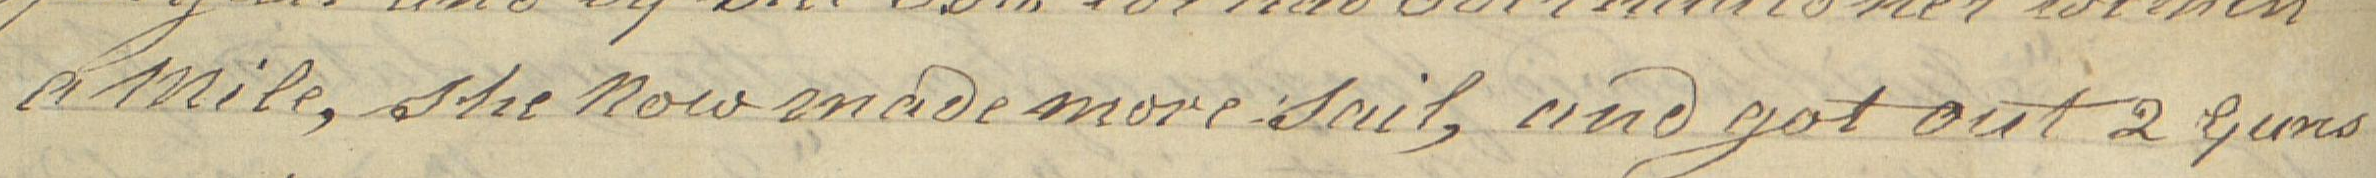A Mile, she Now made more sail, and got out 2 Guns
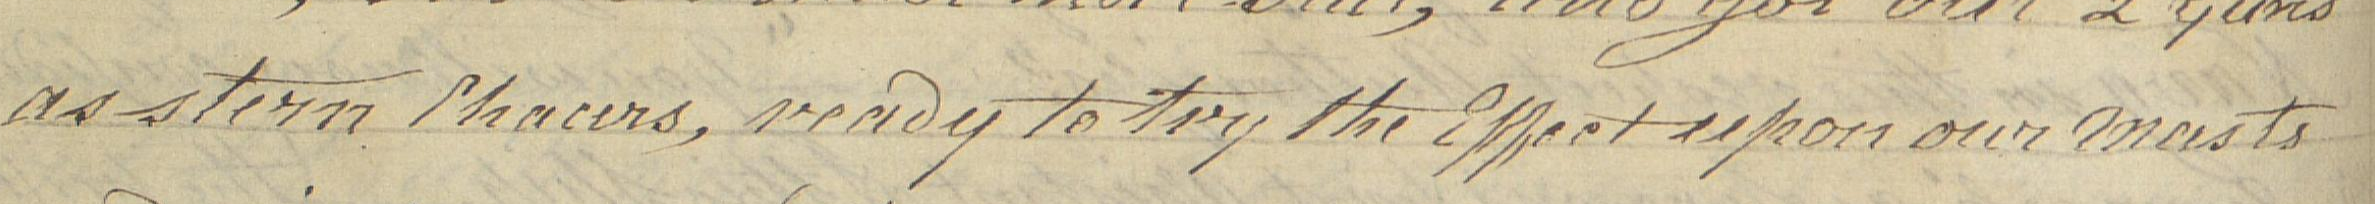as stern Chacers, ready to try the Effect upon our masts
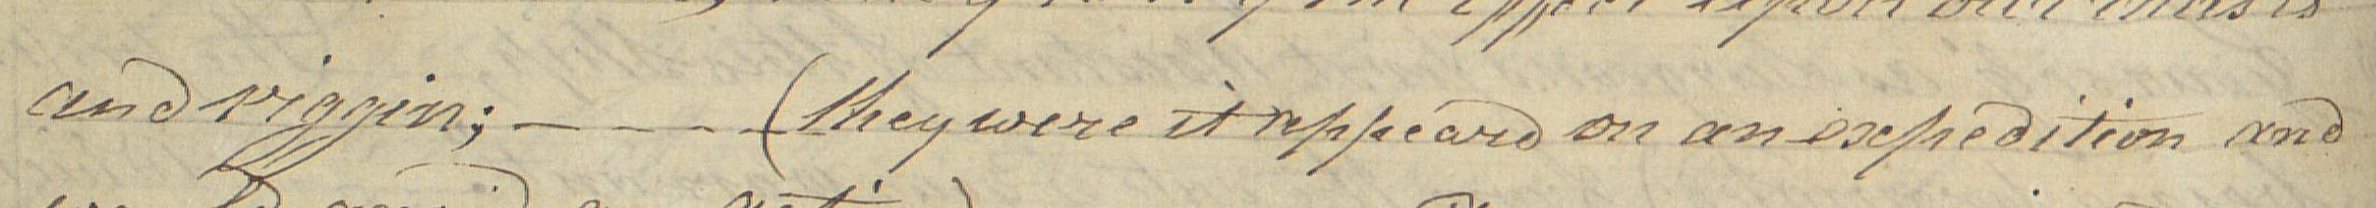and riggin; (they were it appeard on an expedition and
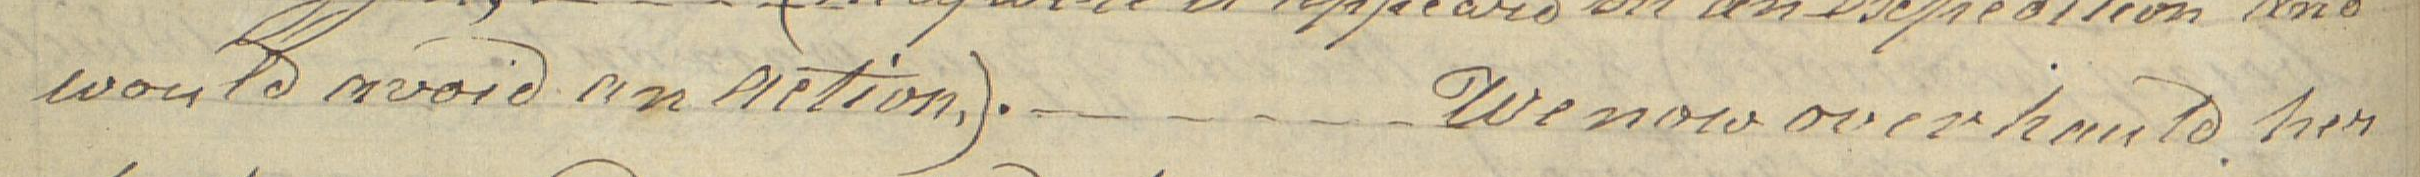would avoid an action). We now over hauld her
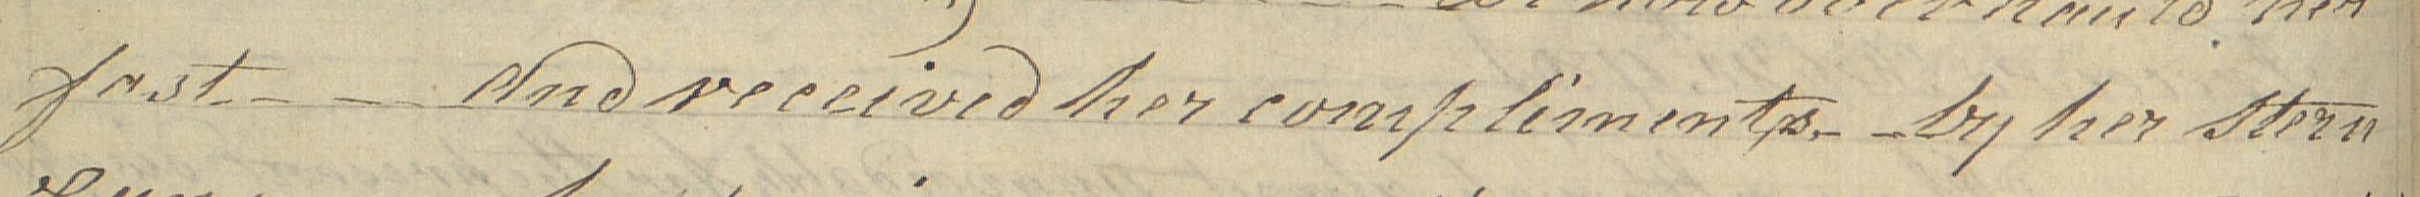fast And received her compliments by her stern
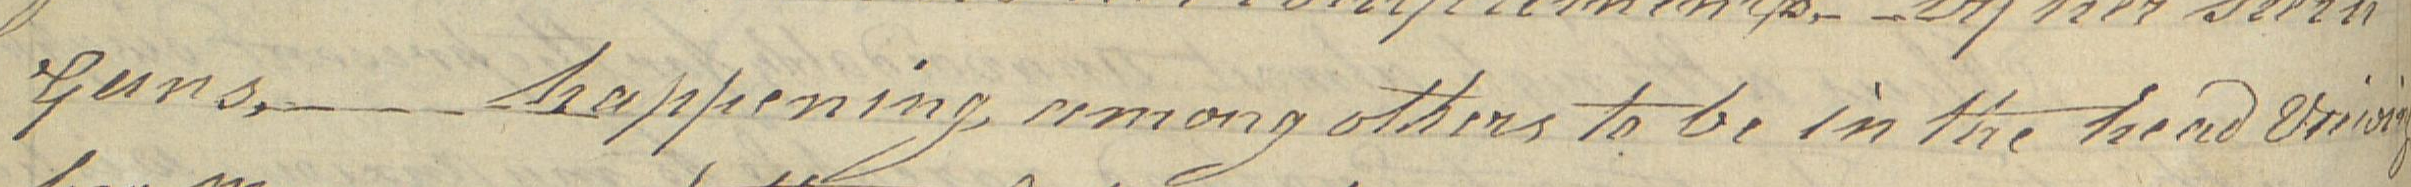Guns, happening among others to be in the head Us-
